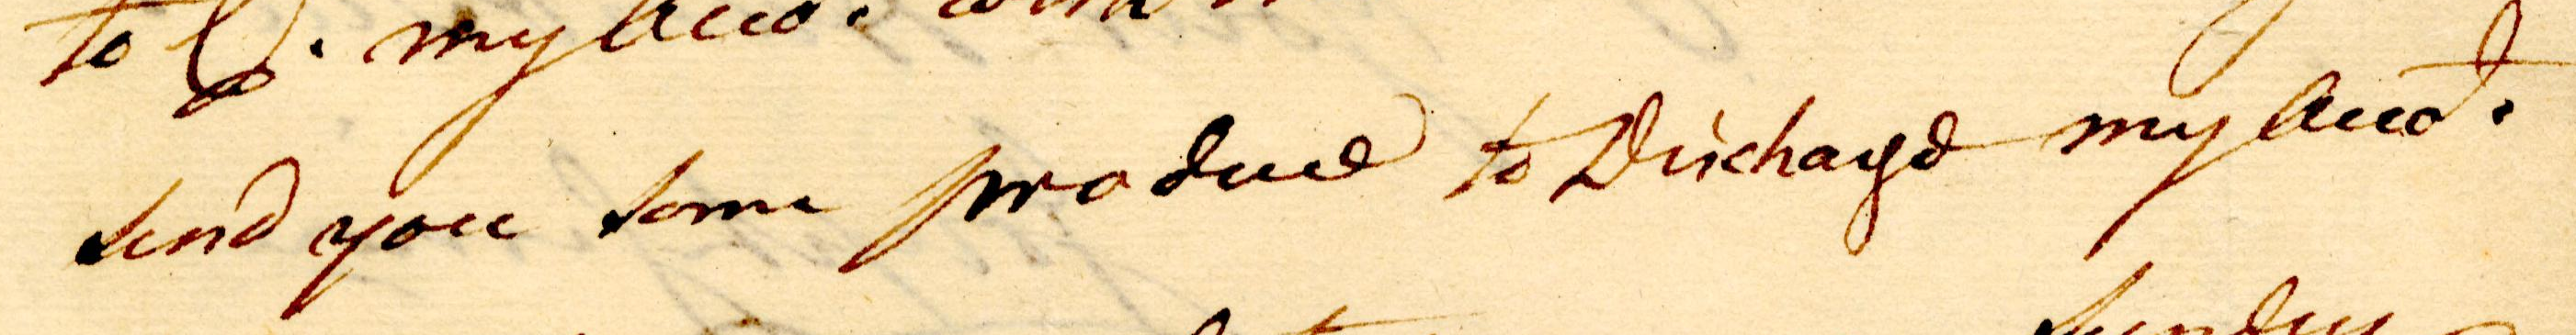send you some produce to Discharge my acco^t
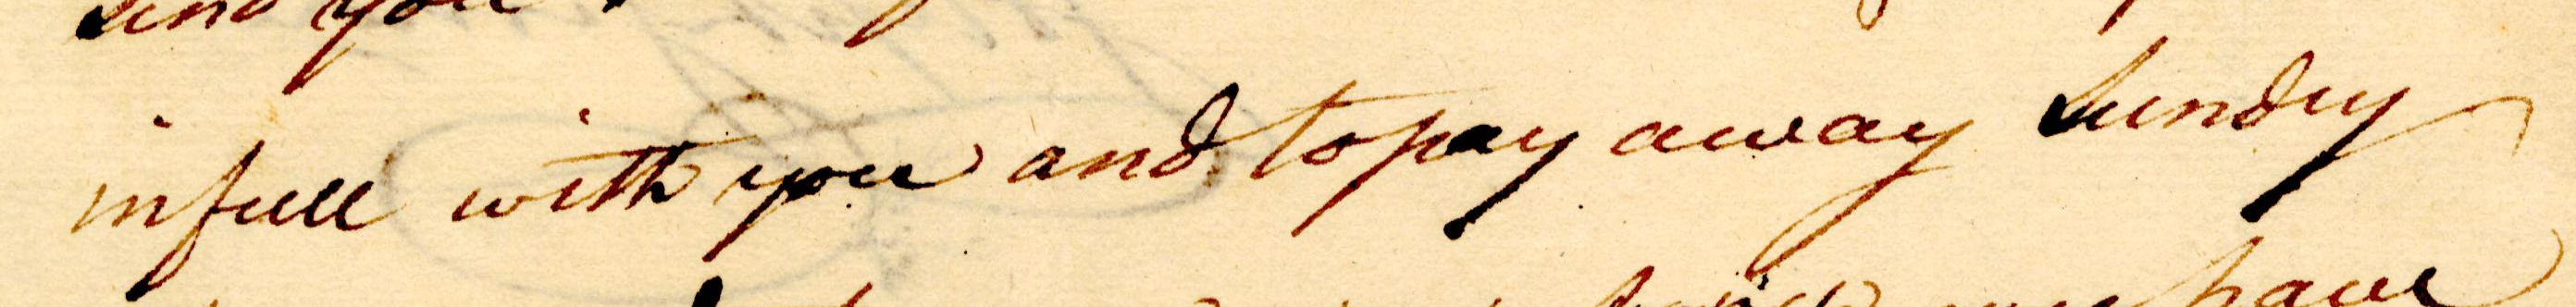infull with you and to pay away sundry
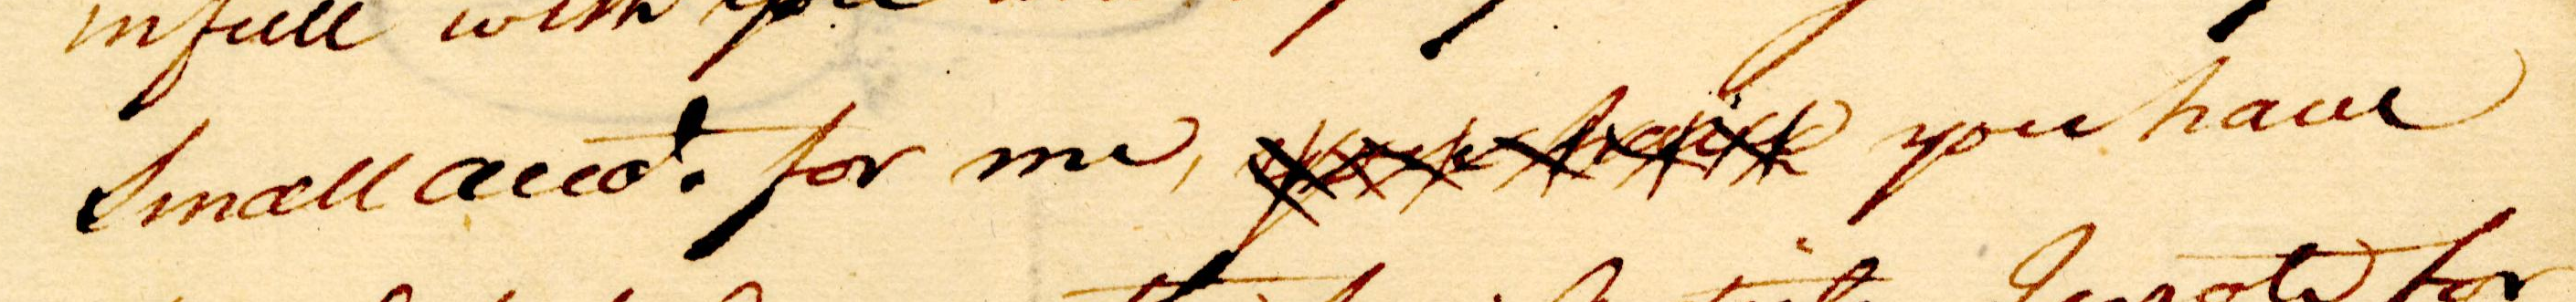Small acco^t. for me, [______] you have
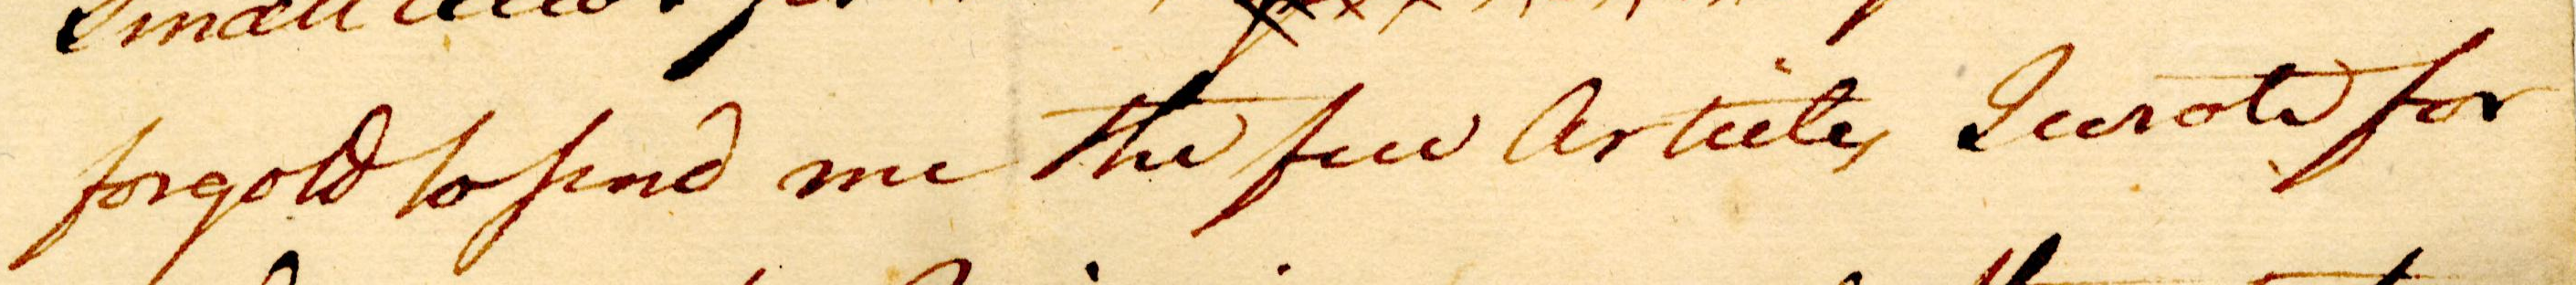forgotd to send me the few Articles I wrote for
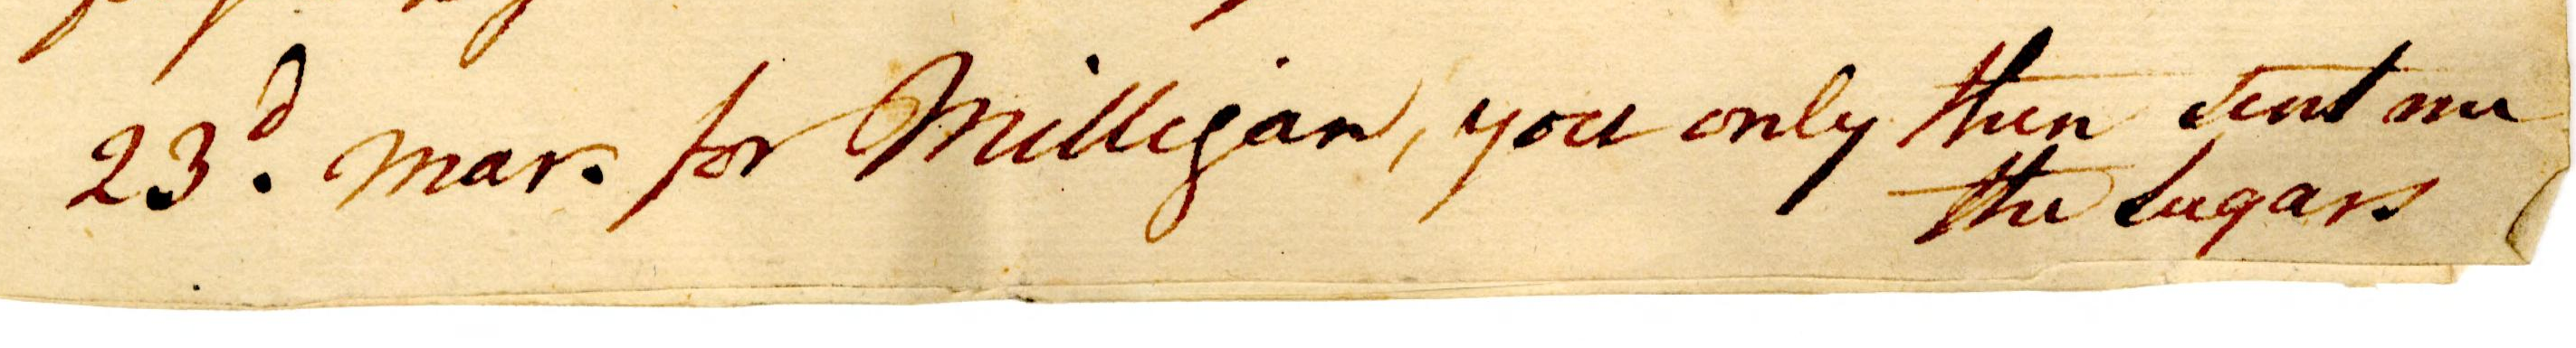23^d. mar. for Milligan, you only the sent me
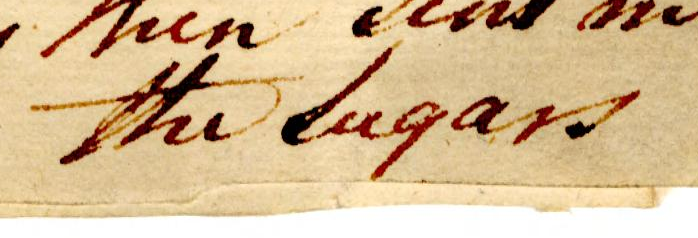the sugars
